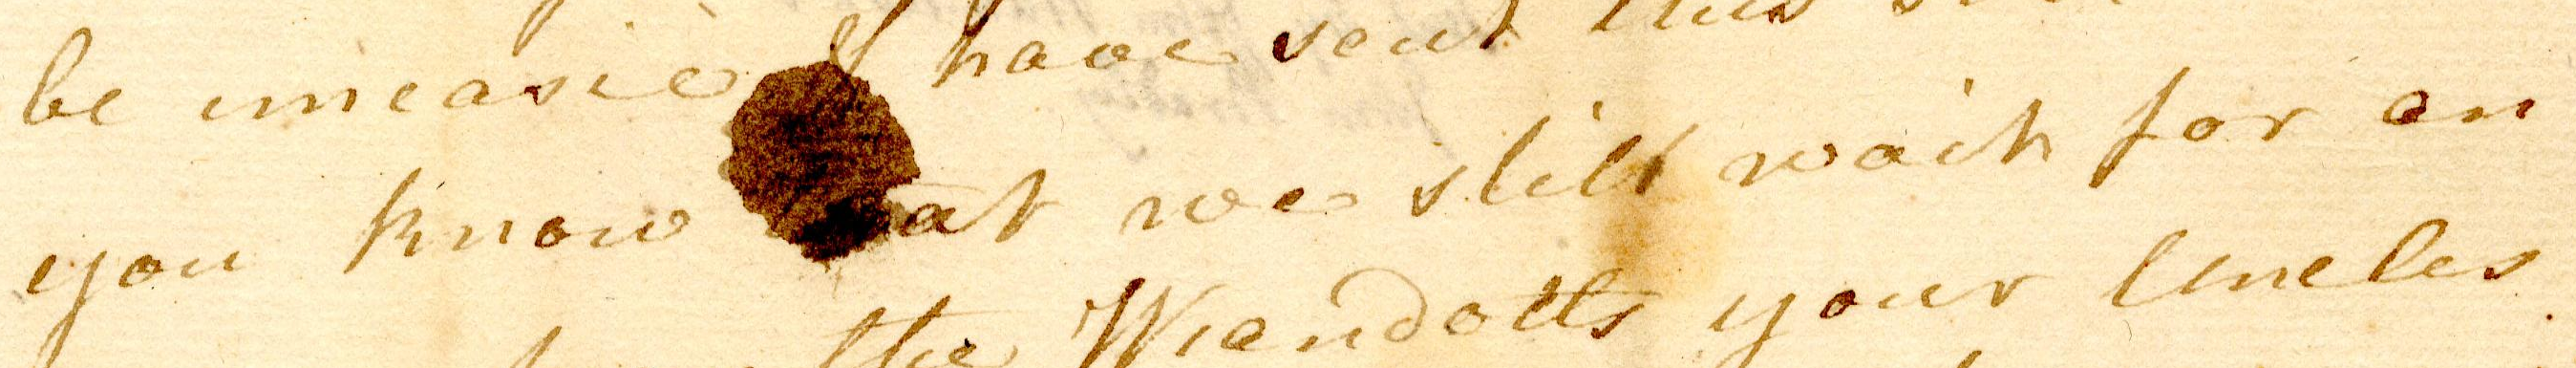you Know that we still wait for our
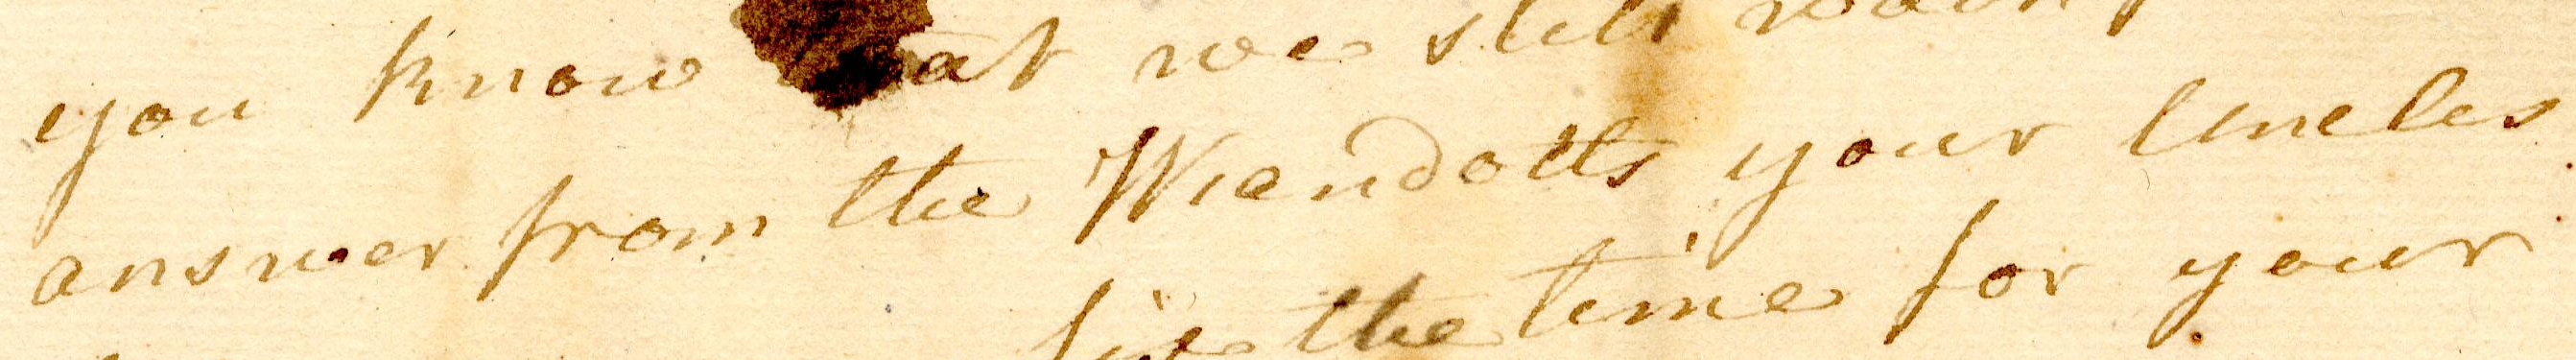answer from the Wiandotts your Uncles
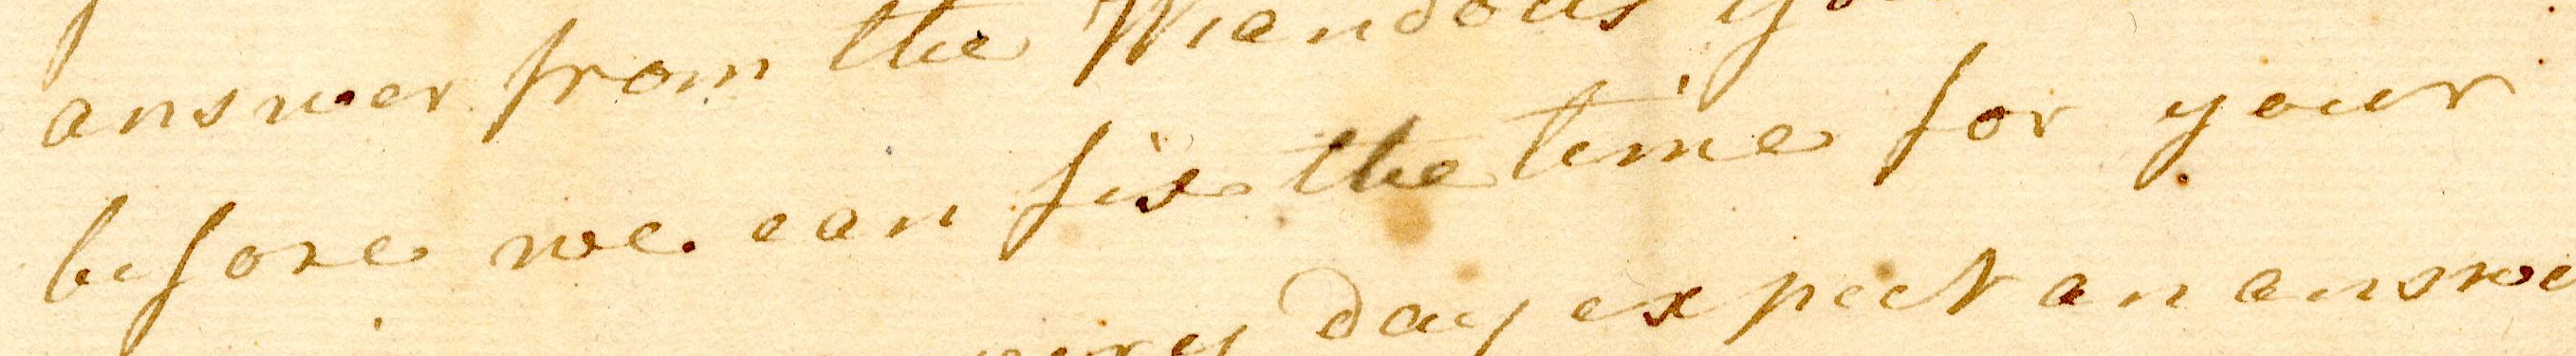before we can fix the time for your
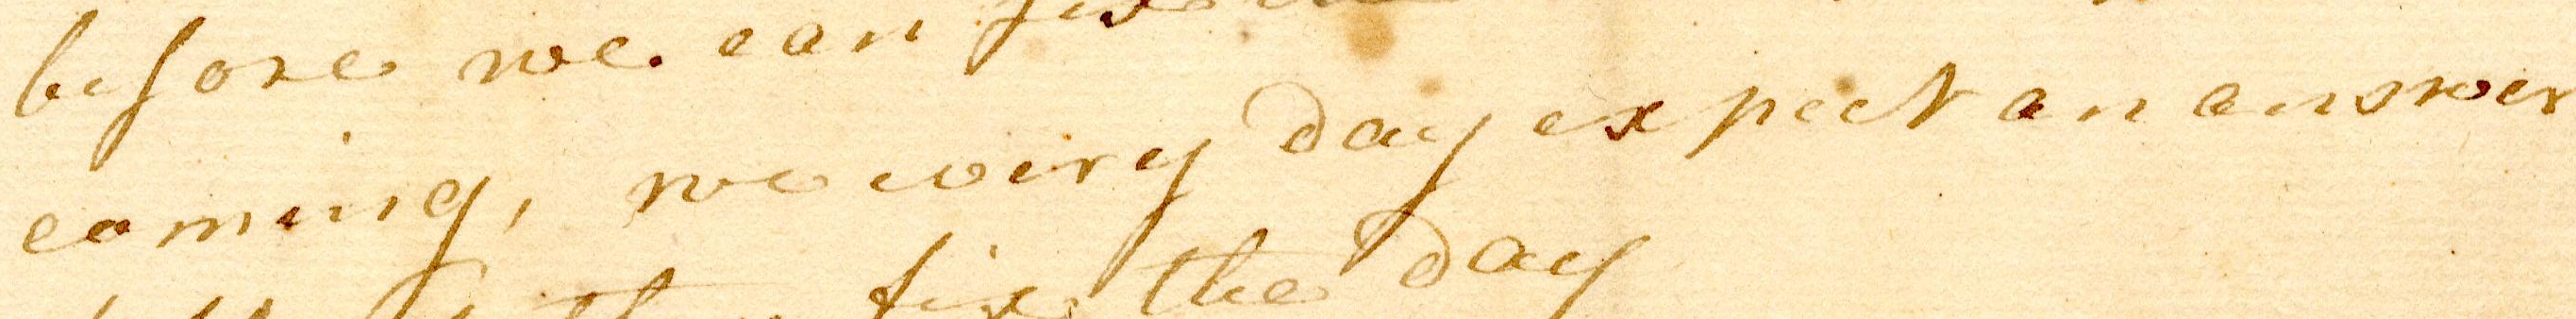coming, we every day expect an answer
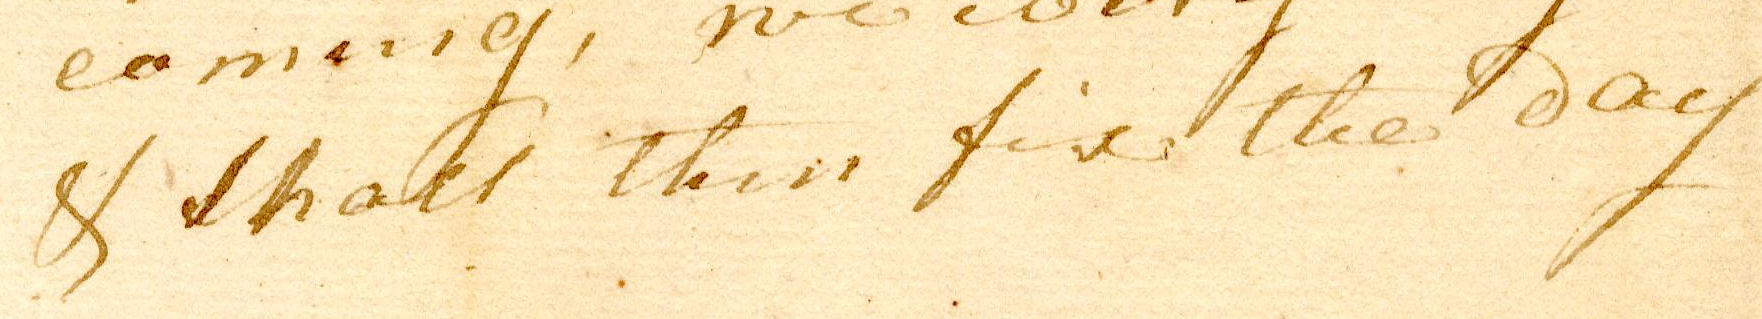& shall then fix the day
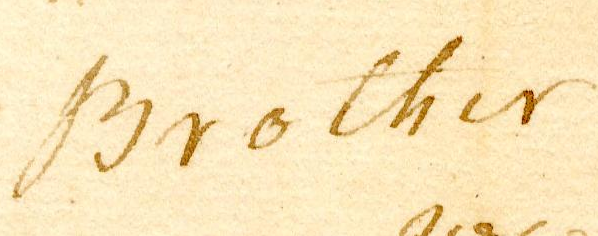Brother
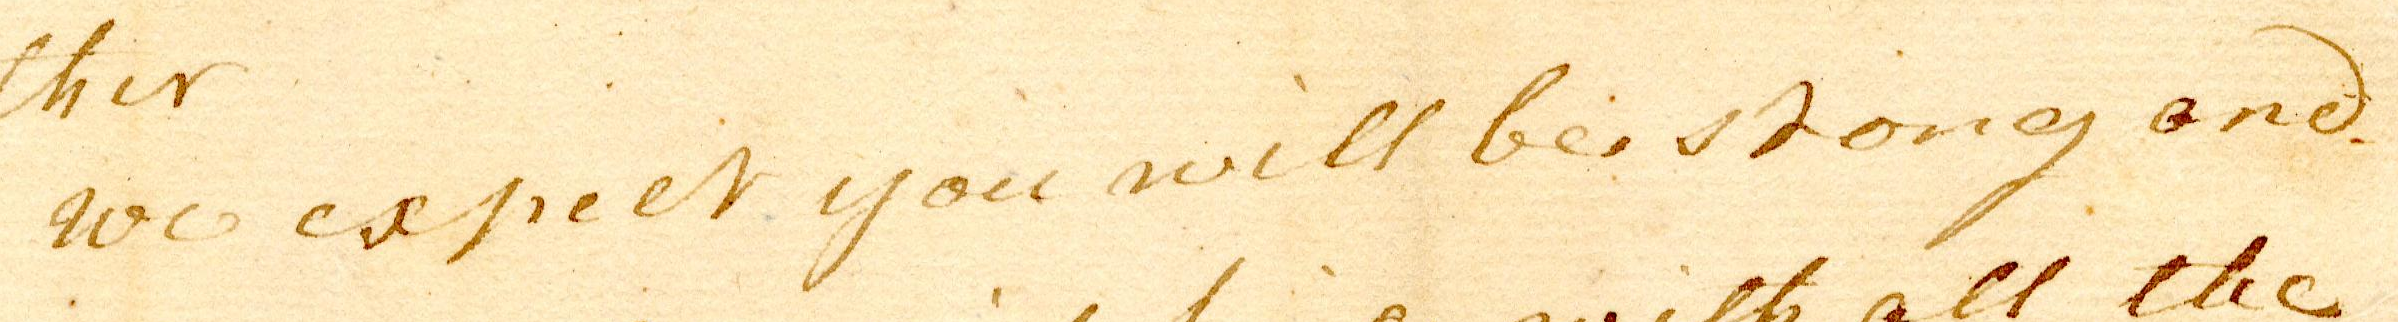We expect you will be strong and
